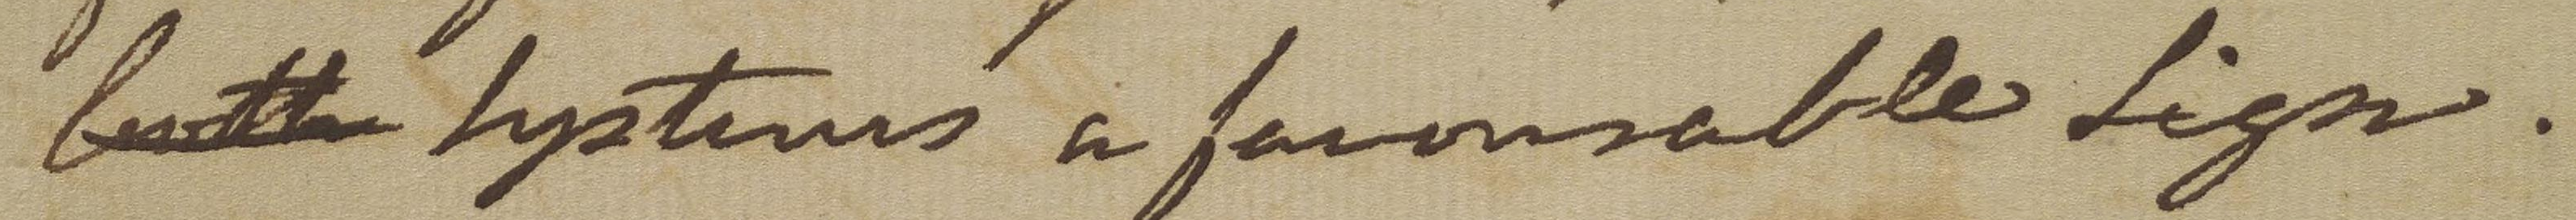systems a favorable sign.
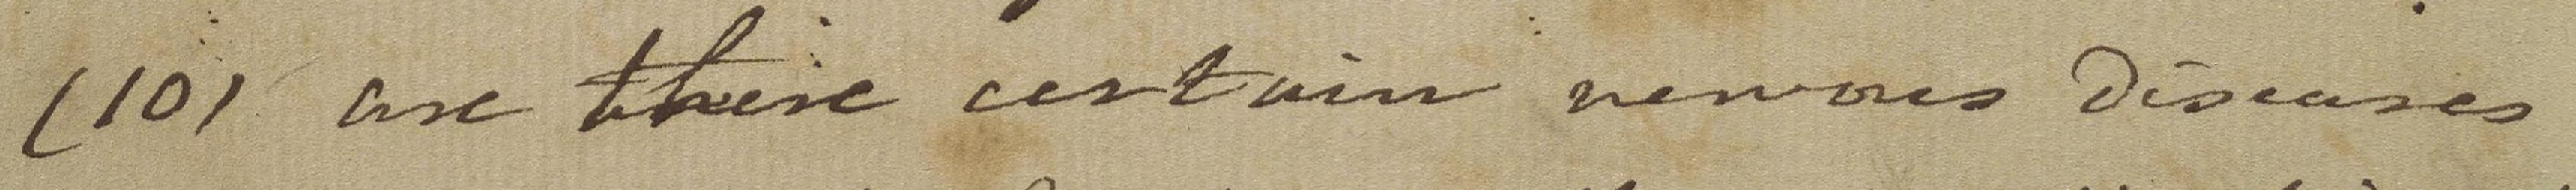(10) Are there certain nervous diseases
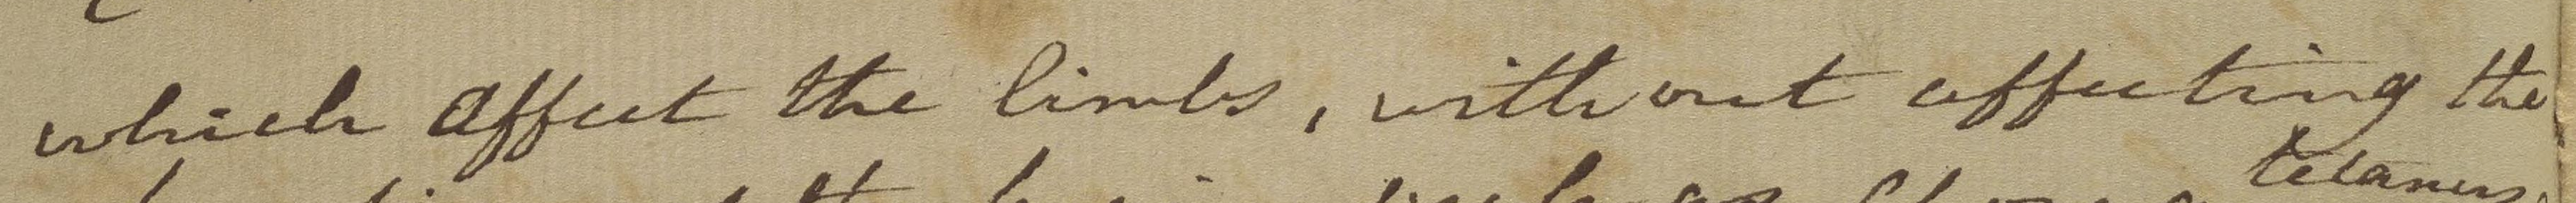which affect the limbs, without affecting the
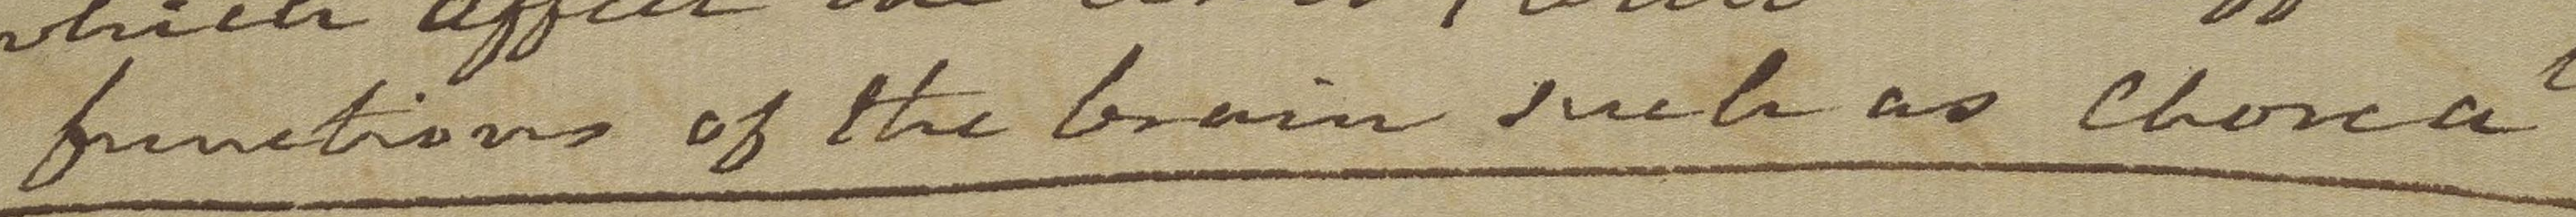functions of the brain such as chorea, tetanus, &c?
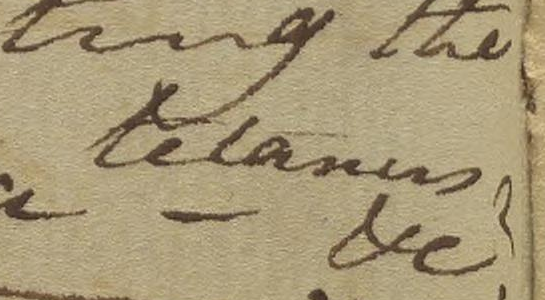tetanus
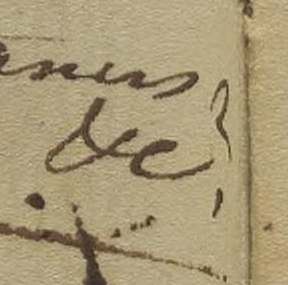&c?
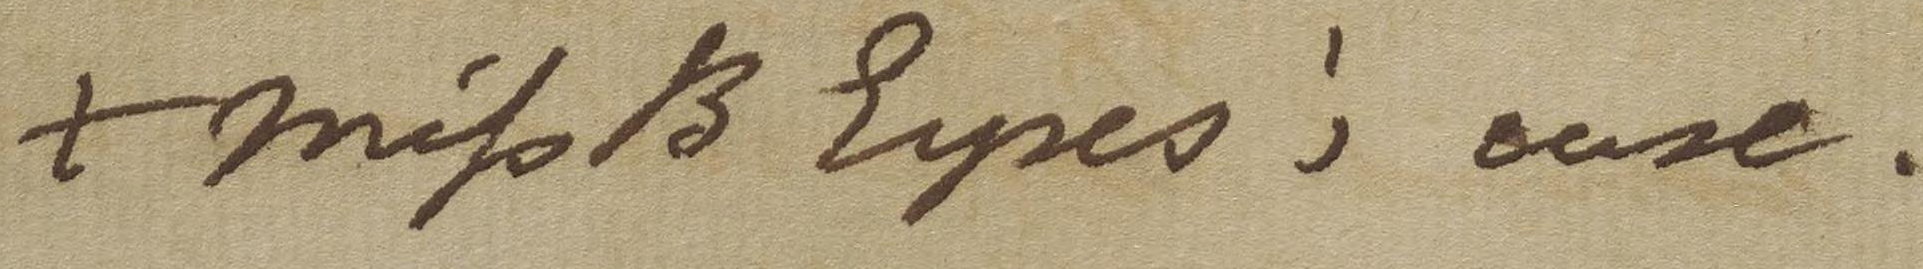+ Miss B Eyses's case
